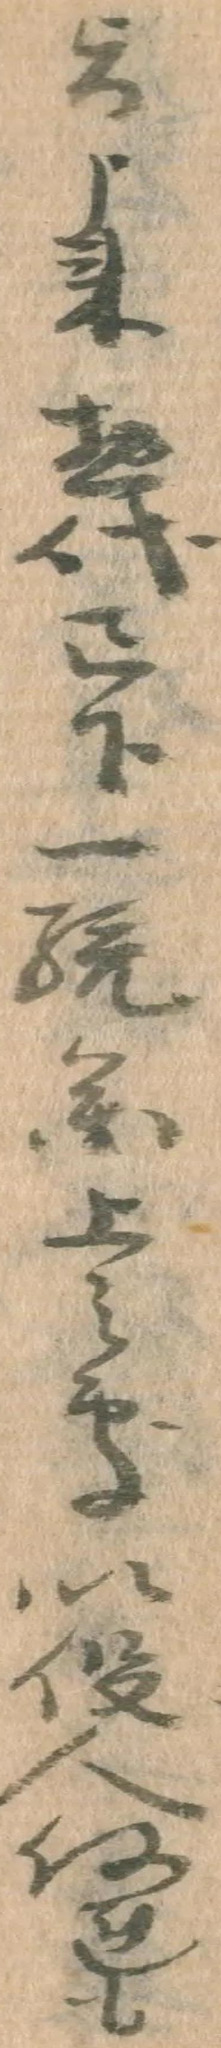旨申来、惣代已下一統参上之處、御役人何れも
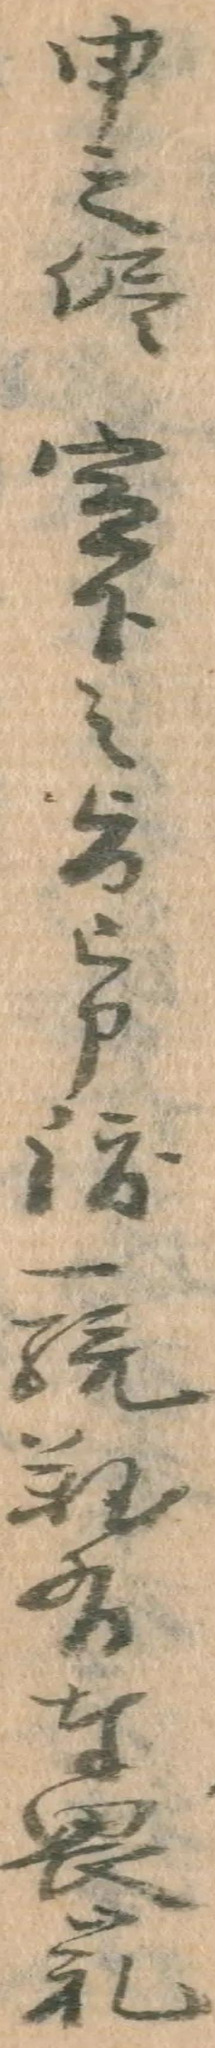申之儘宣下之旨被申渡、一統難有奉畏御礼
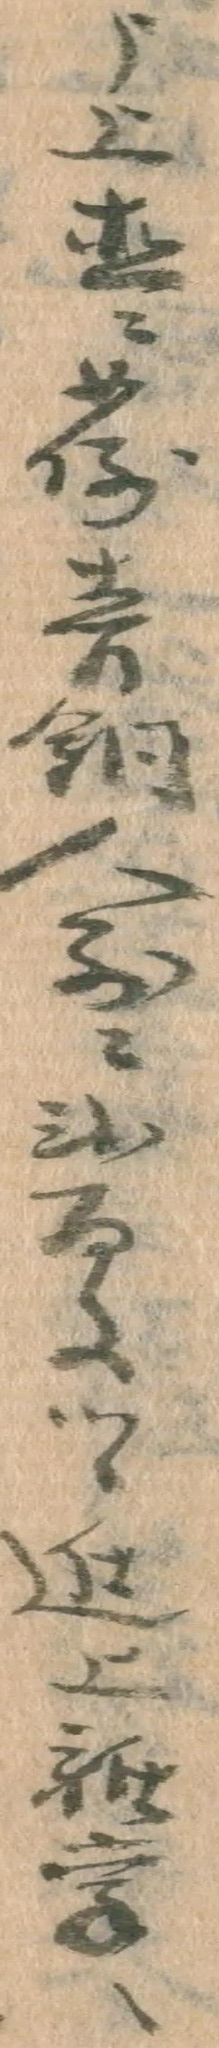申上、直二如例青銅人別二弐百文ツヽ進上、雑掌へ
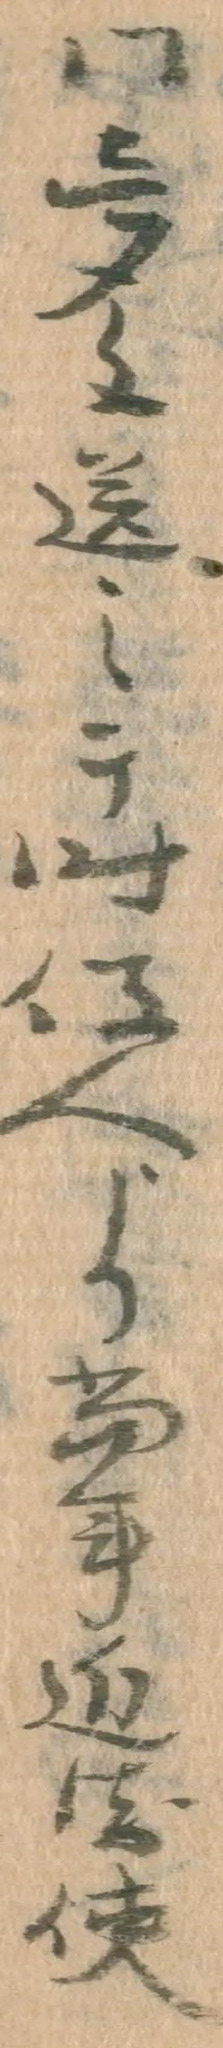同壱〆匁送之、于時役人より当年近衛使
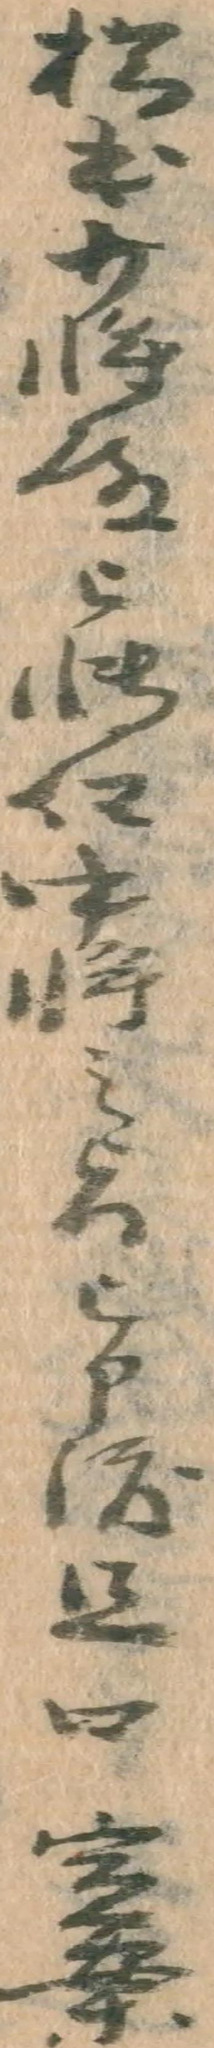橋本少将殿被転任中将之旨被申渡、且口宣案
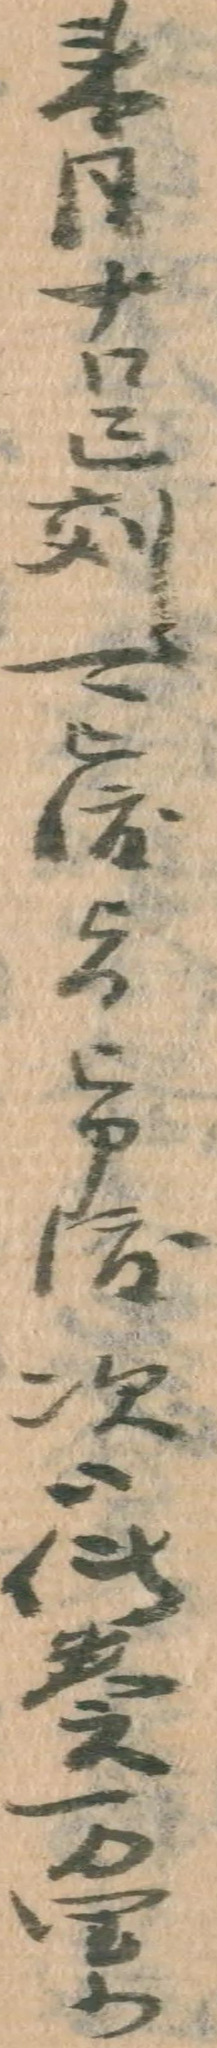来月十日巳刻可被渡旨被申渡、次ハ傳奏万里小
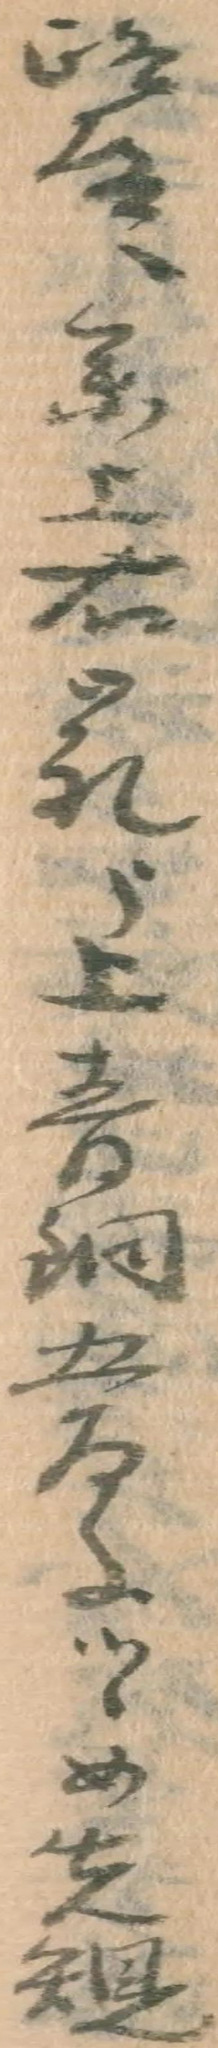路殿へ参上、右御礼申上、青銅五百文ツヽ如先規
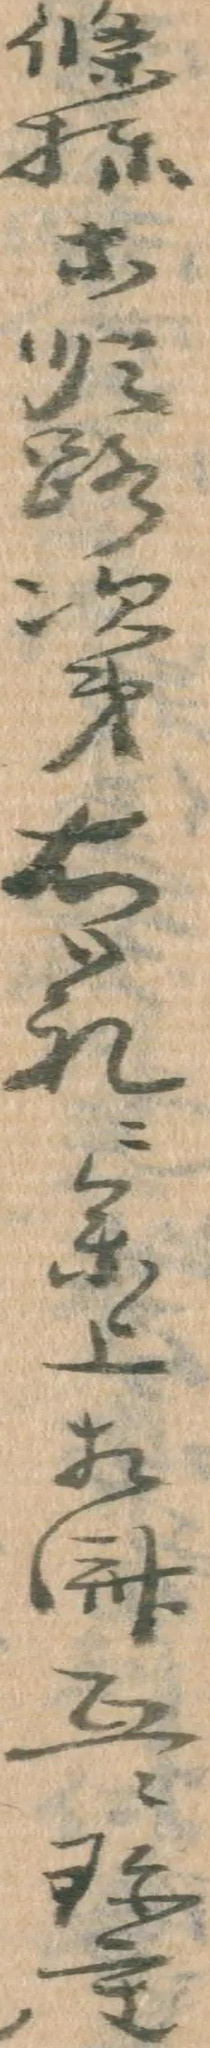条様等順路次第右御礼ニ参上相済、互に珍重
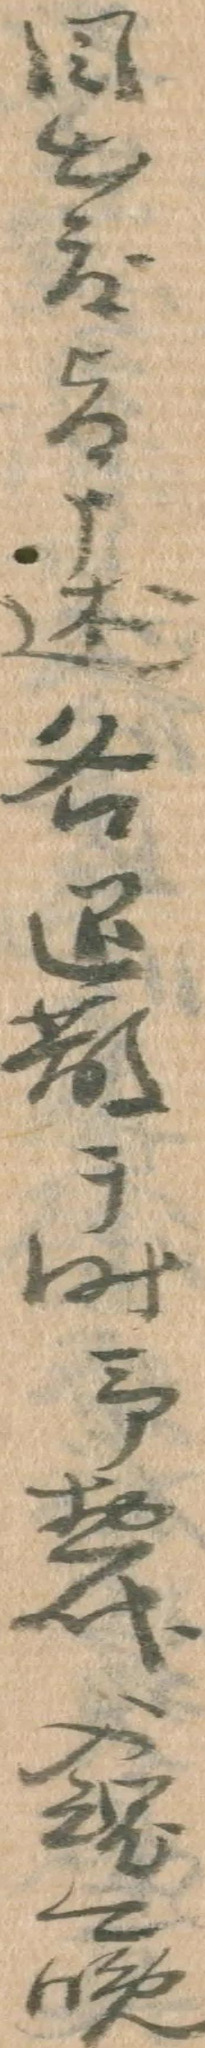目出度旨申述、各退散、于時予惣代へ入魂、今晩
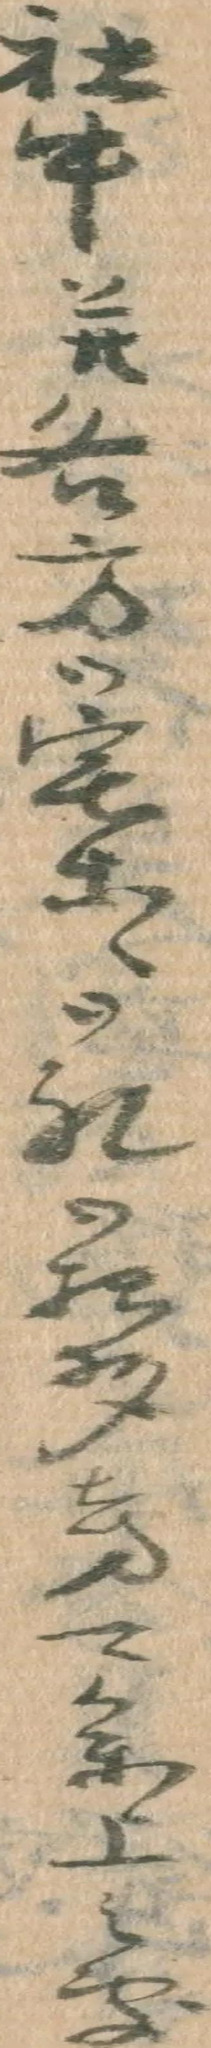社中幷各方御宅等へ御礼御相聞旁可参上之處、
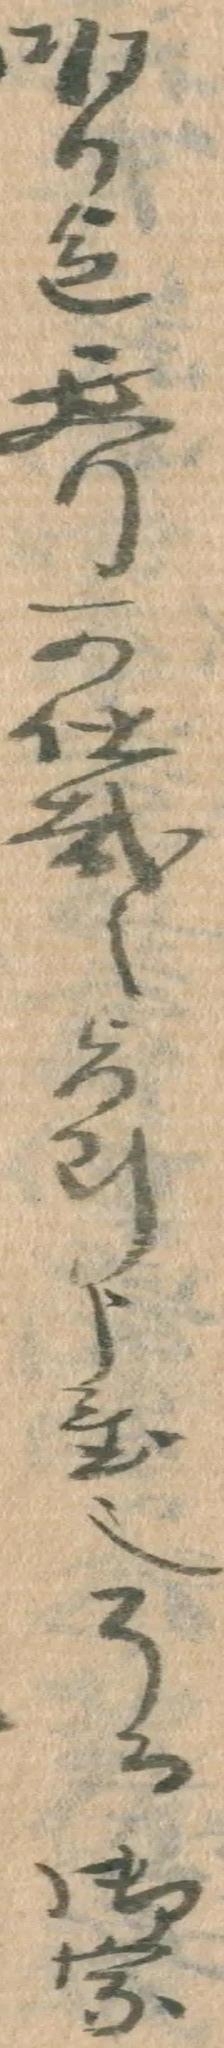明日迄延引可仕哉之旨断申置也、了而、御家
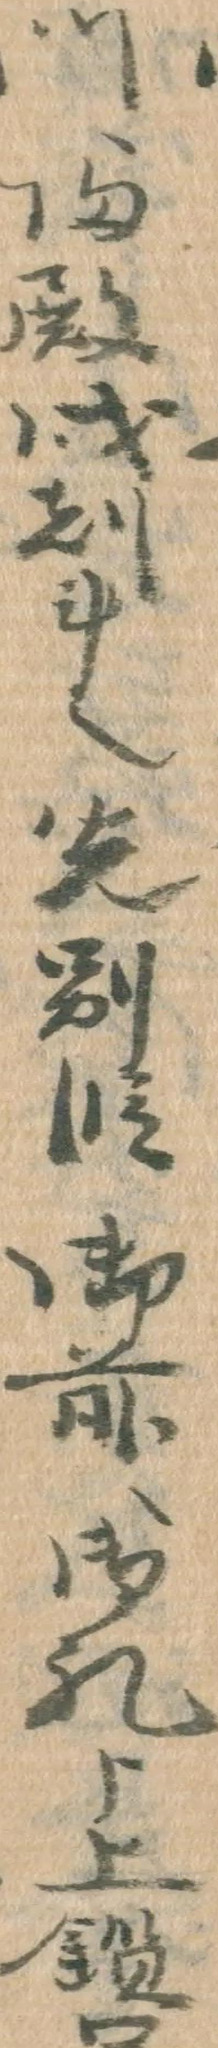門へ帰殿、戌刻斗也、先別段御前へ御礼申上口
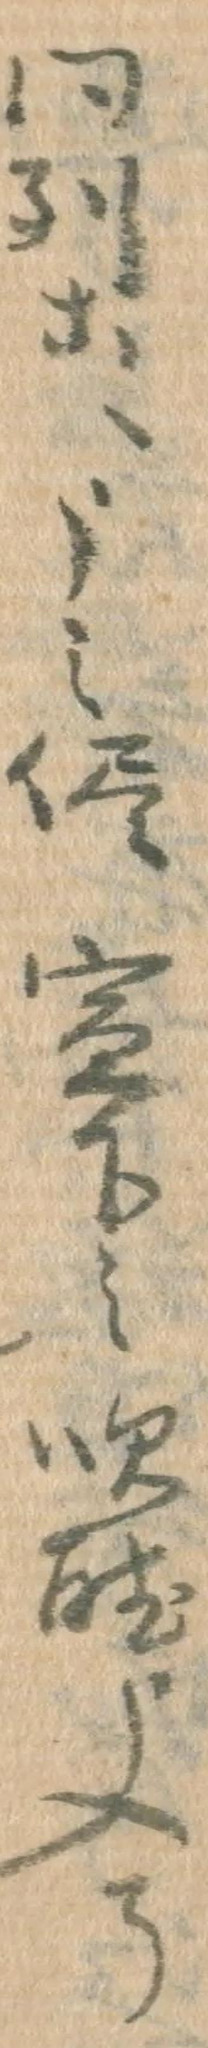同列等へ申候、侭宣下之吹聴申入了、
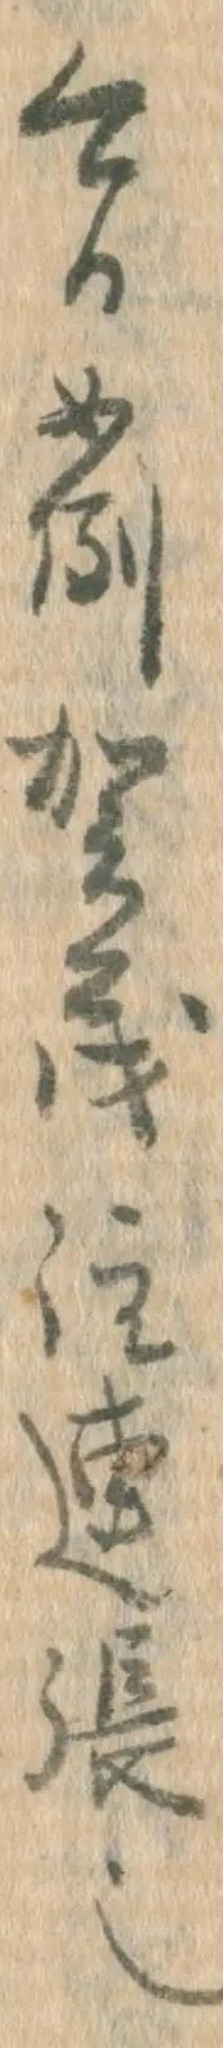今日如例賀茂注連張也、
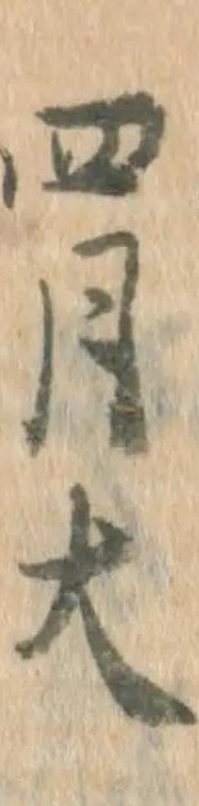四月大
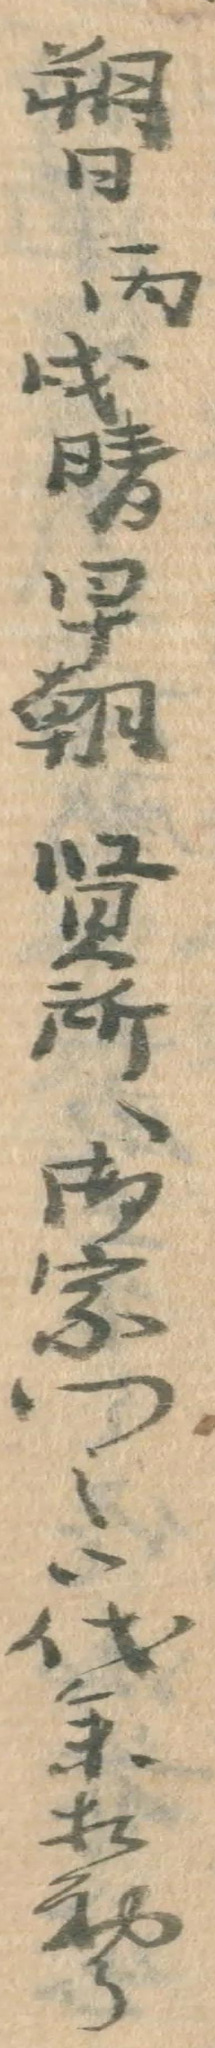朔日丙戌晴、早朝賢所へ御家門之御代参相勤了、
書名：賀茂社記録. 第63冊
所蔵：国立国会図書館 National Diet Library, JAPAN
